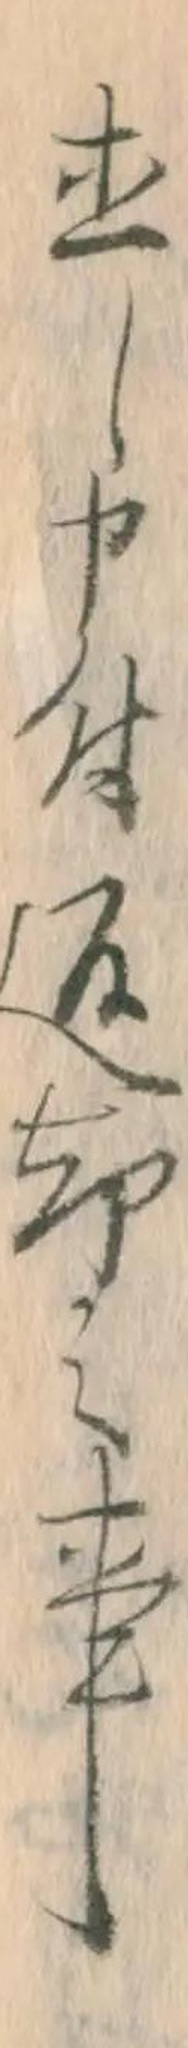直し申付返却之事
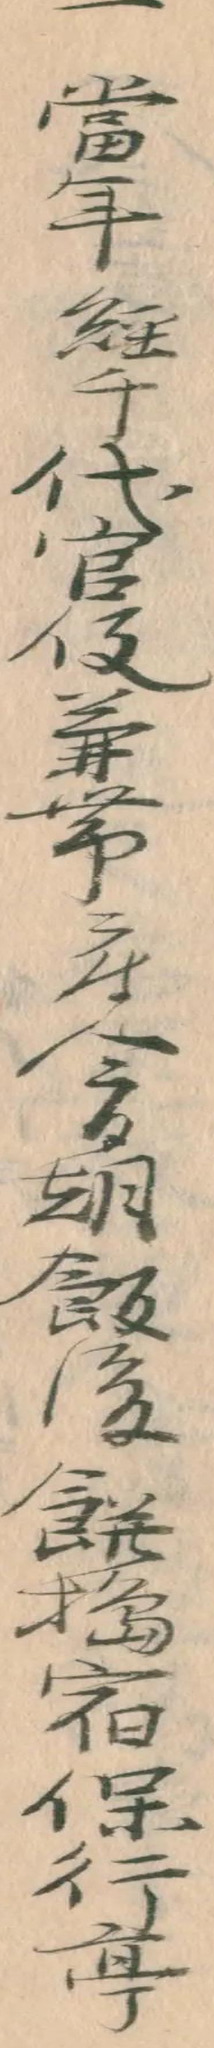一當年経千代官役兼帯ニ付今日朝飯後餅搗宿保行亭
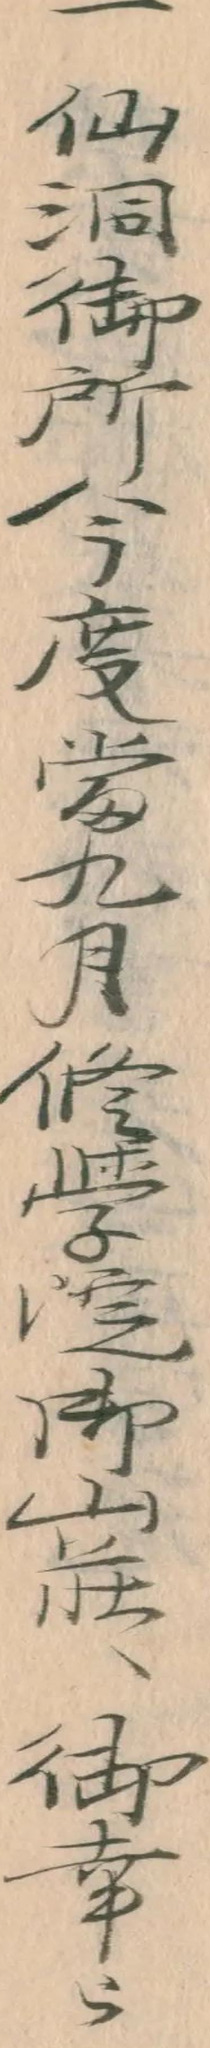一仙洞御所今度當九月修學院御山荘へ御幸被
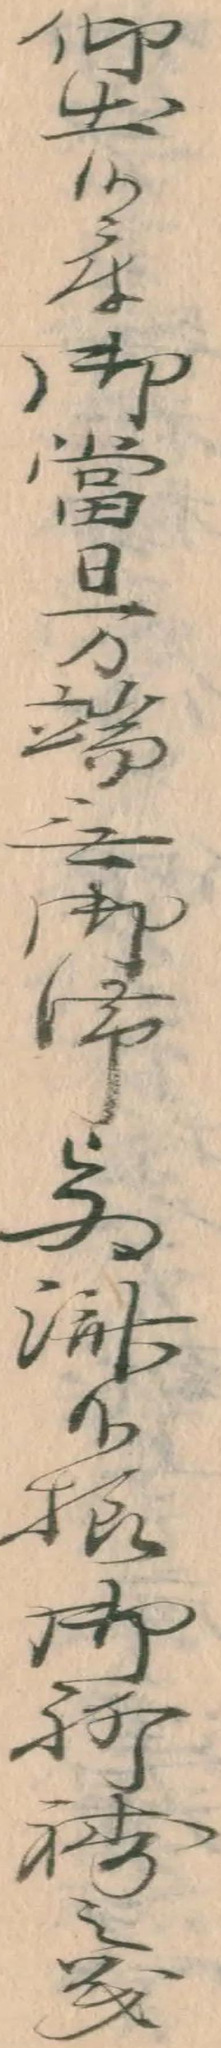仰出候ニ付御當日万端無御滞被為済候様御祈祷之義
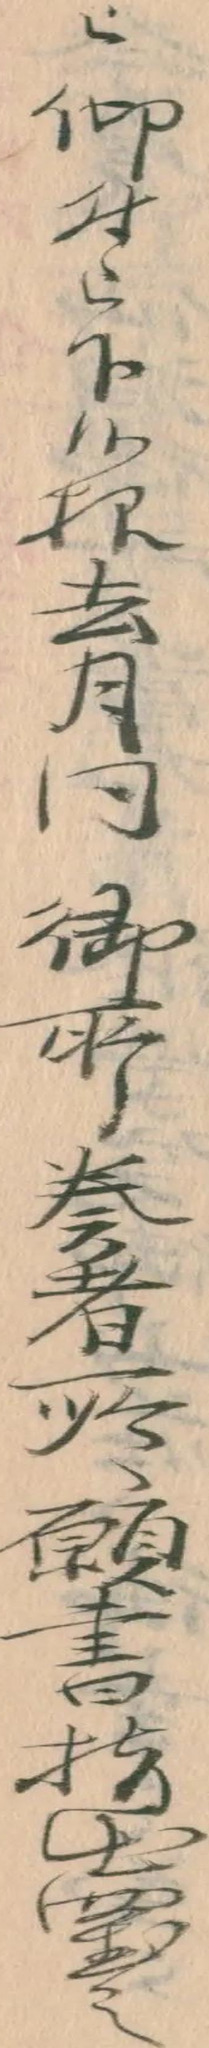被仰付被下候様去月同御所奏者所へ願書指出置之
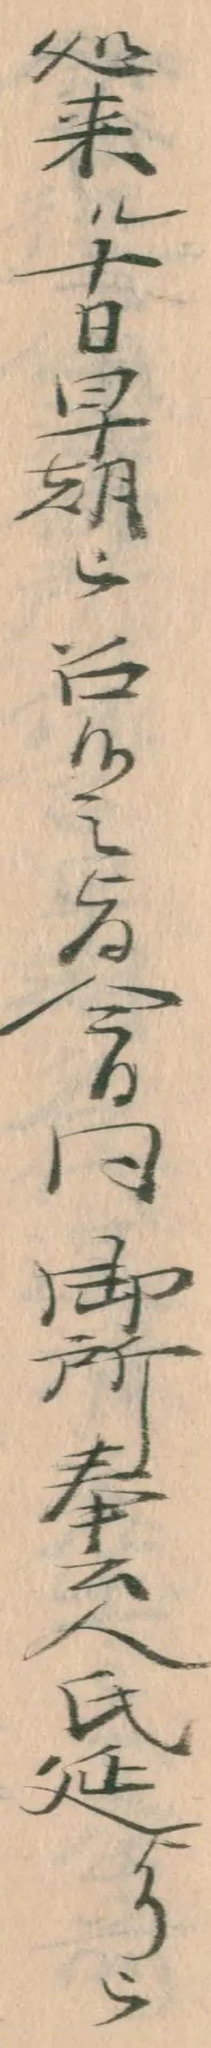処来ル十日早朝被召候之旨今日同御所奉公人氏廷より被
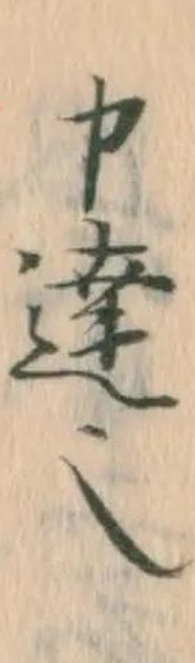申達也
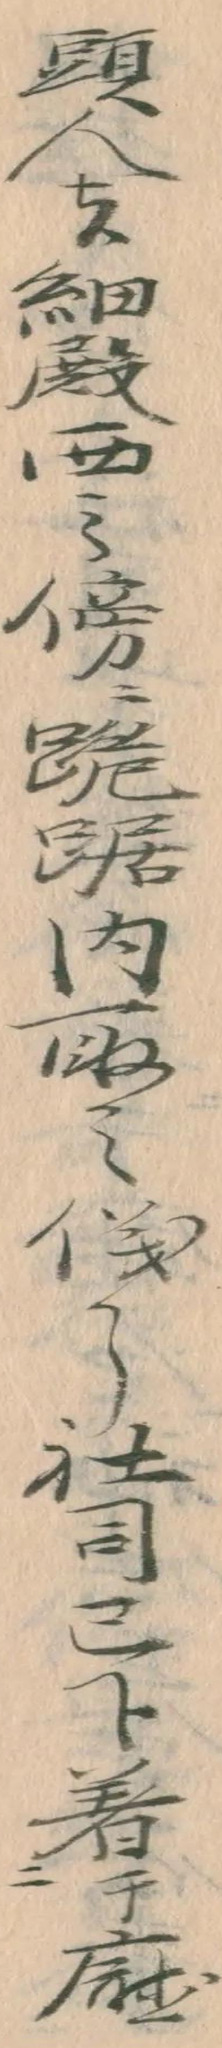頭人は細殿西之傍ニ跪踞内取之儀了社司已下着于廰
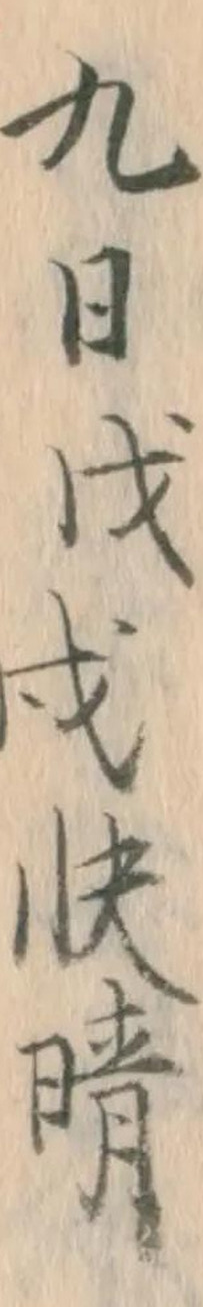九日戊戌快晴

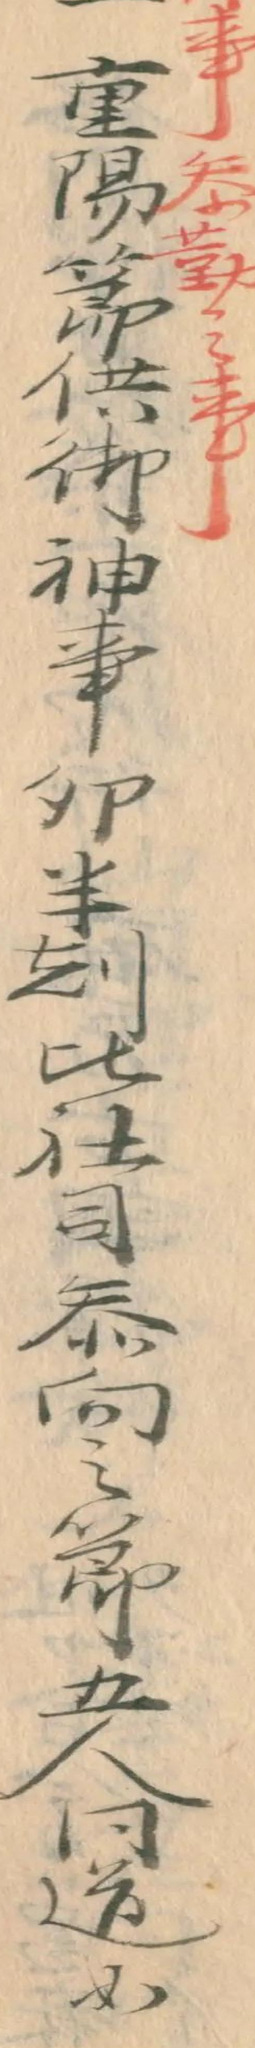一重陽節供御神事卯半刻比社司参向之節五人同道如
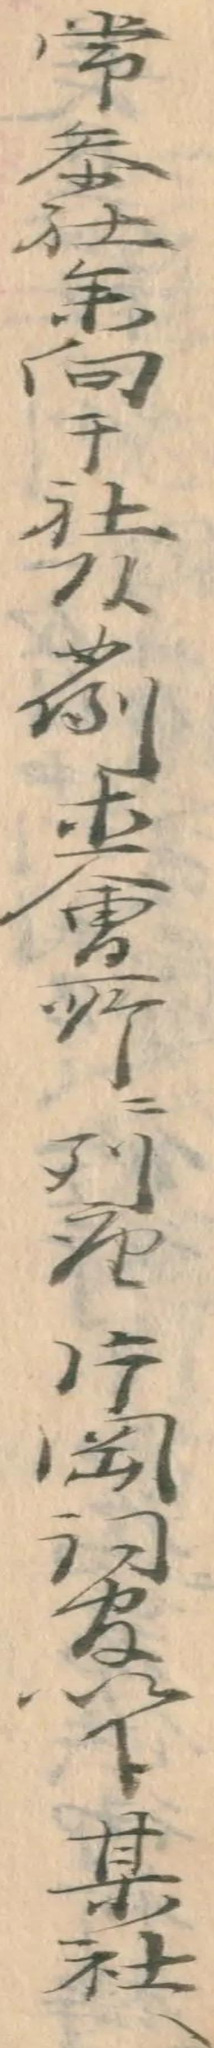常参社参向于社頭如例直會所ニ列座片岡祠官以下某社へ
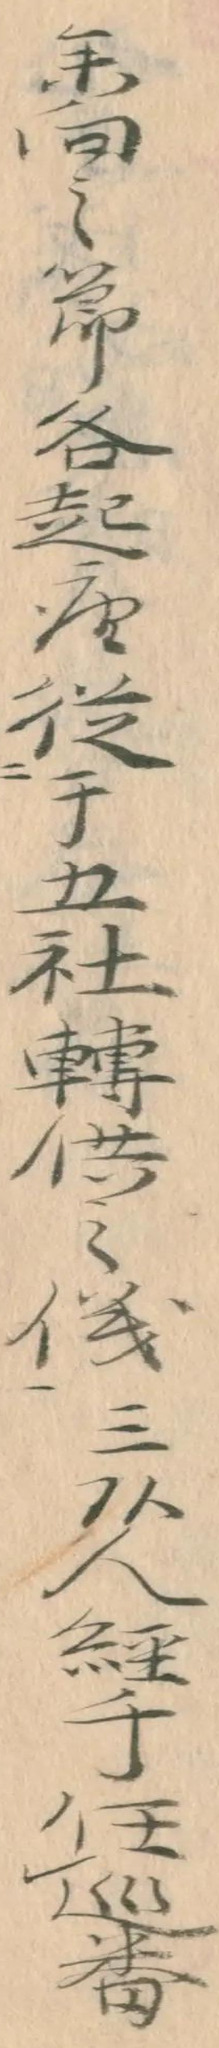参向之節各起座従于五社轉供之儀三頭人経千任巡番
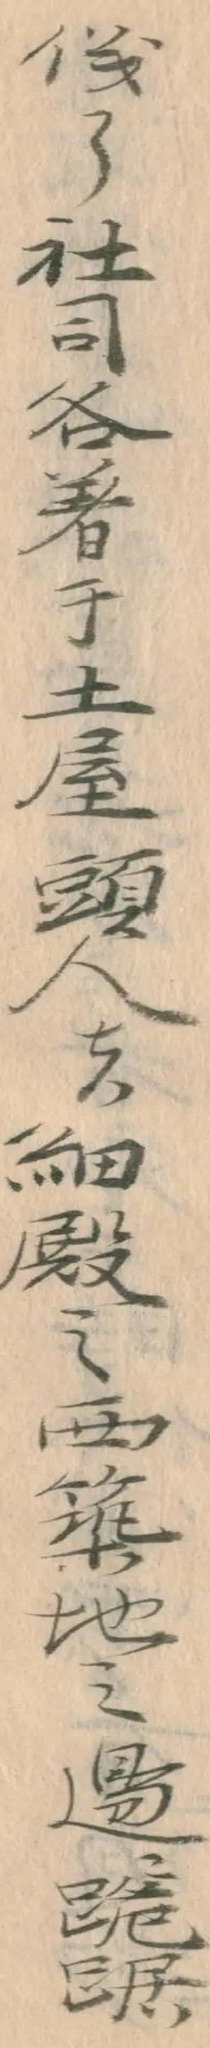儀了社司谷着于土屋頭人は細殿之西築地之邊へ跪踞
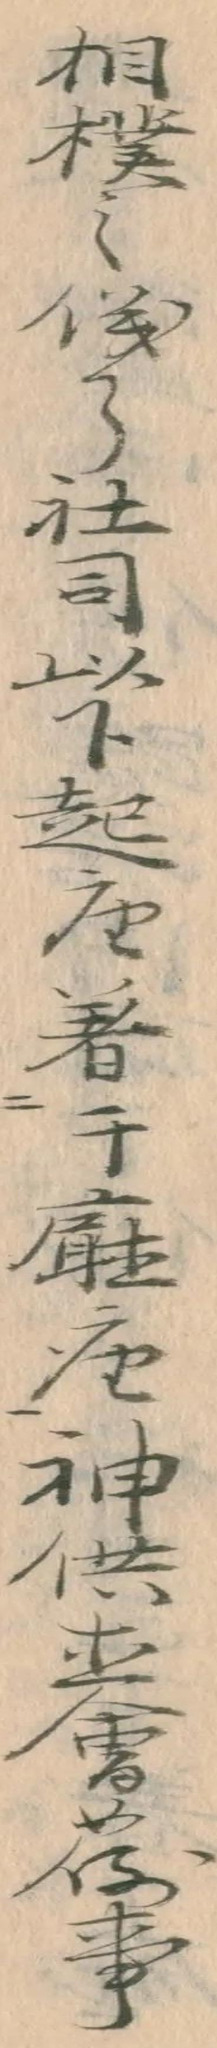相撲之儀了社司以下起座着于廰座神供直會如例事
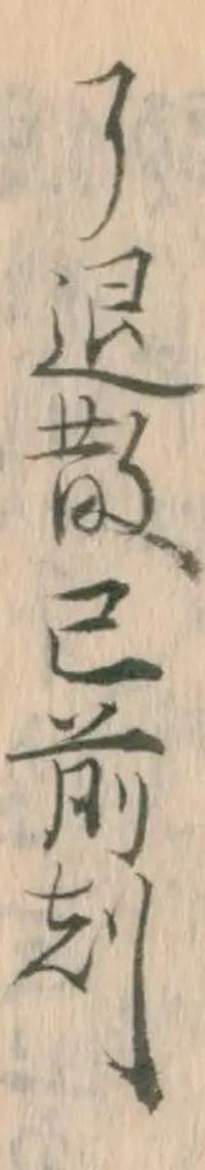了退散巳前刻
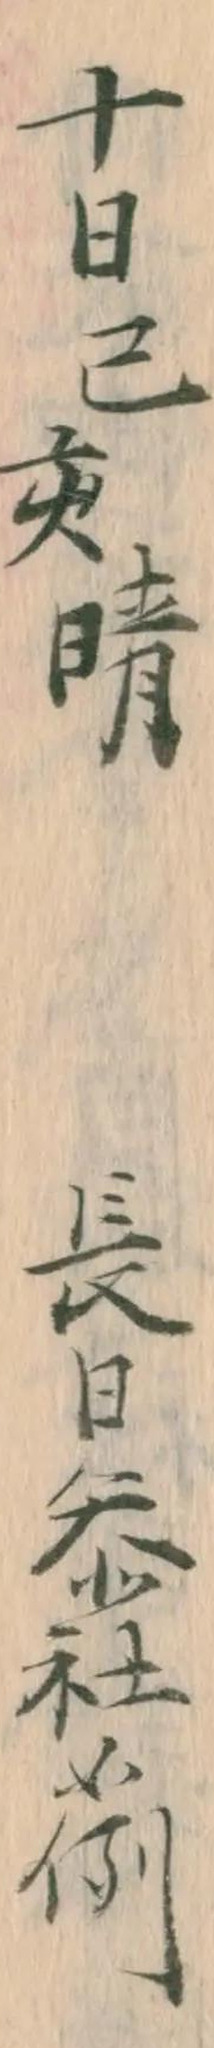十日己亥晴長日参社如例
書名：賀茂社記録. 第74冊
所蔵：国立国会図書館 National Diet Library, JAPAN
